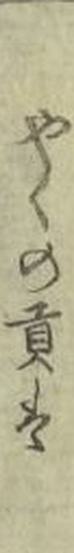やくの貢は
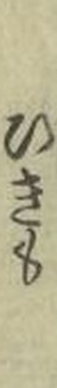ひきも

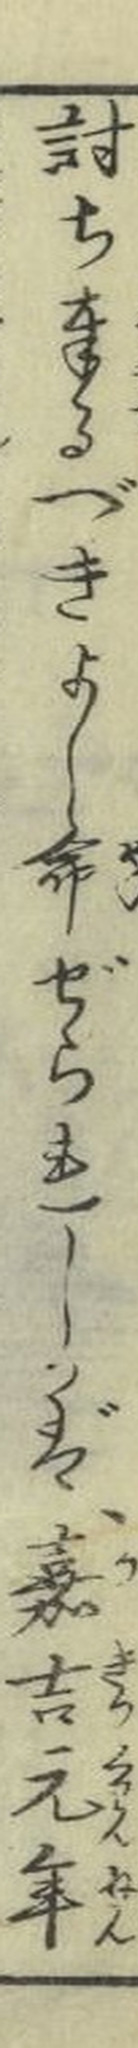討ち奉るべきよし命ぜられしかば、嘉吉元年
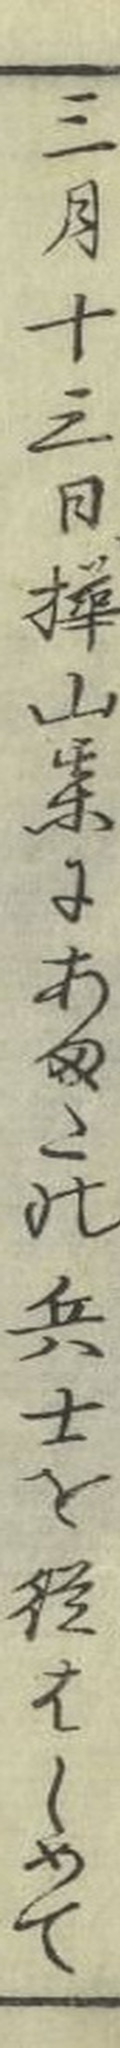三月十三日、樺山某にあまたの兵士を従はしめて
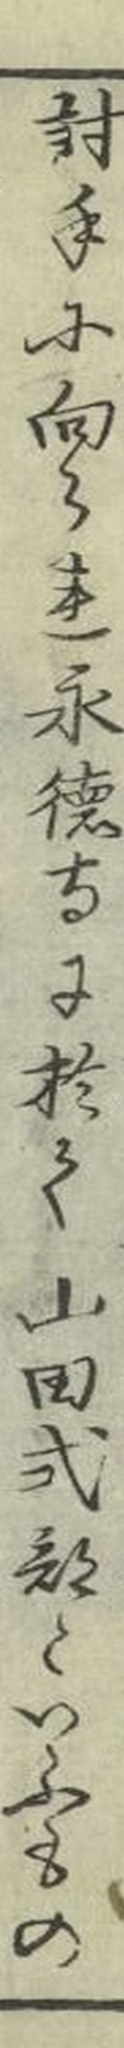討手に向られ、永徳寺に於て、山田式部といふもの
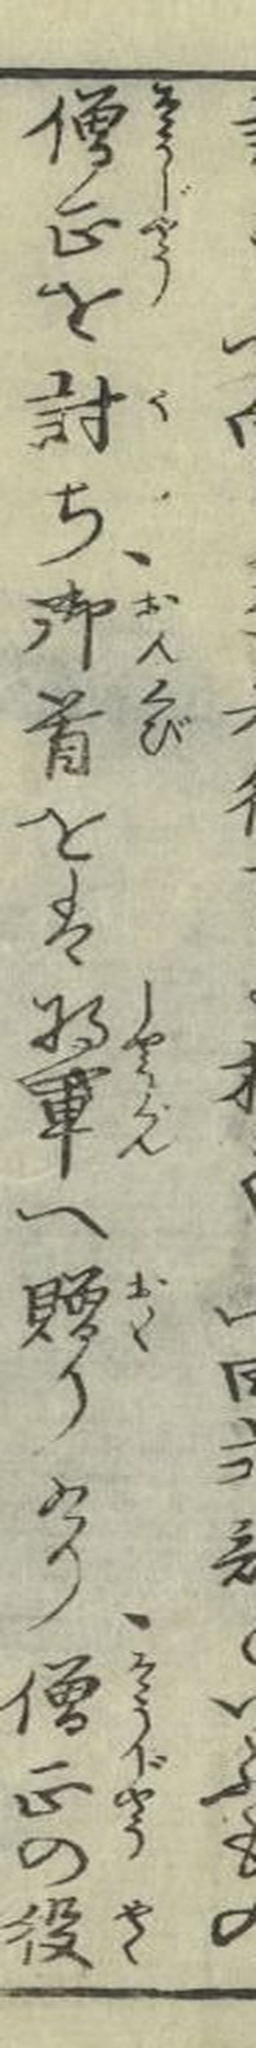僧正を討ち、御首をは将軍へ贈りけり、僧正の役
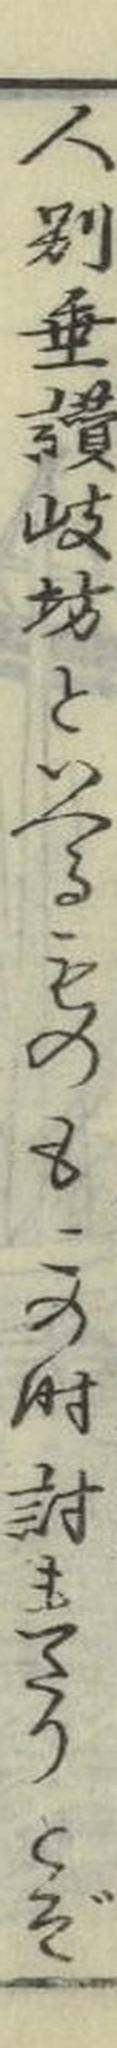人別垂讃岐坊といへるものも、この時討れたりとぞ
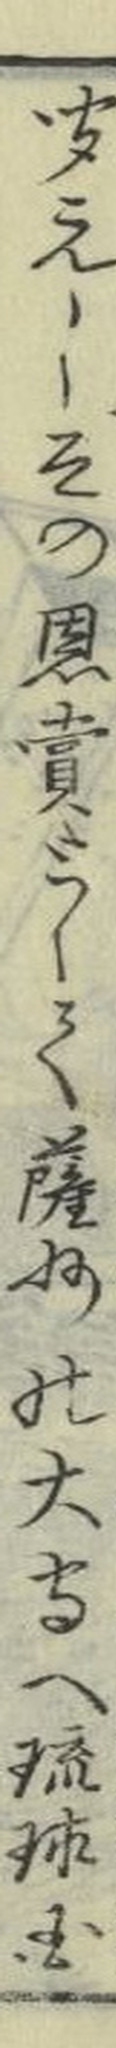聞えしその恩賞として、薩州の大守へ琉球国
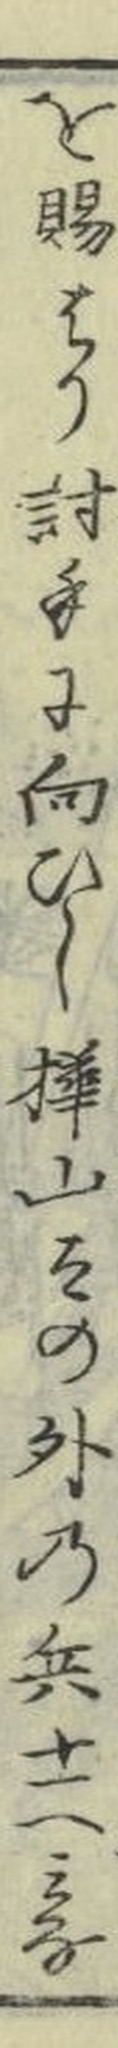を賜はり、討手に向ひし樺山その外の兵士へ、みな
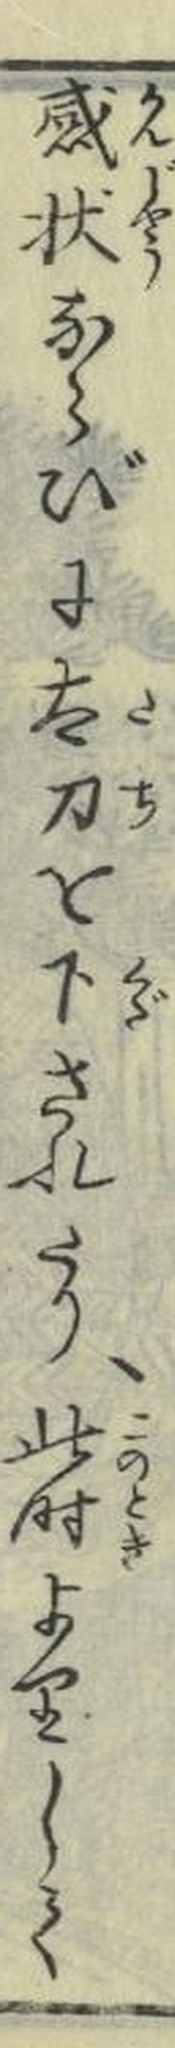感状ならびに太刀を下されたり、此時よりして
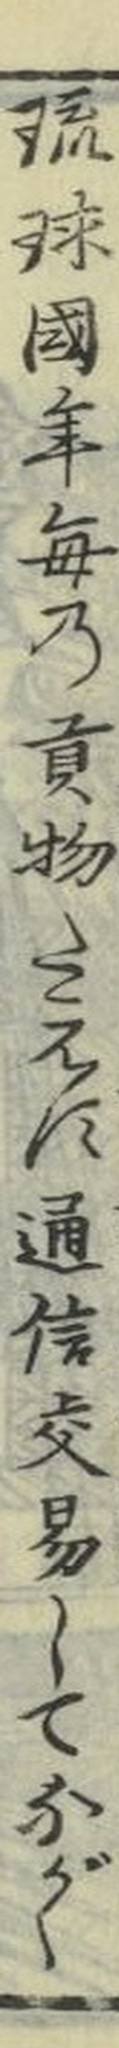琉球国年毎の貢物たえず、通信交易してながく
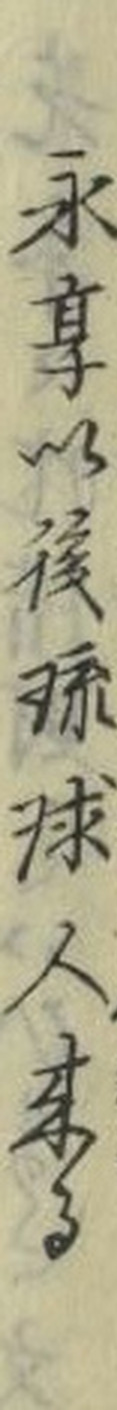永享以後琉球人来る
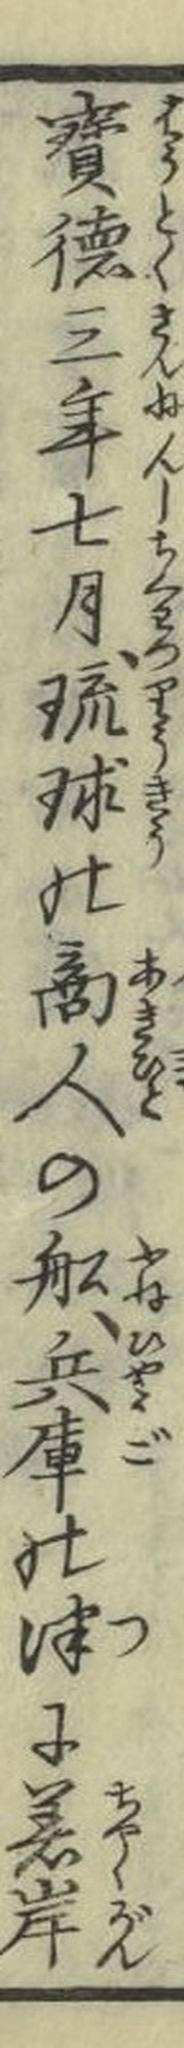宝徳三年七月、琉球の商人の船、兵庫の津に着岸
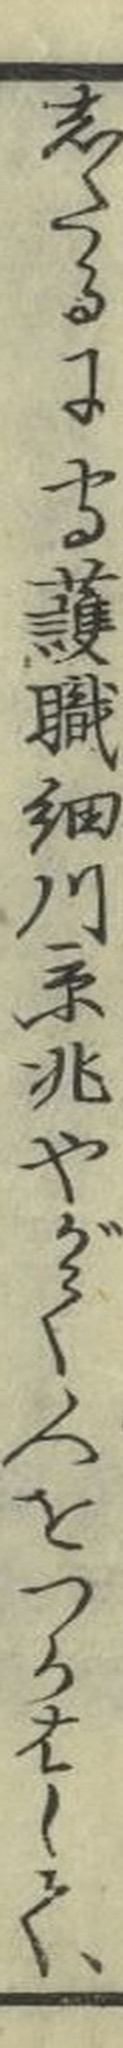したるに、守護職細川京兆やがて人をつかはして、
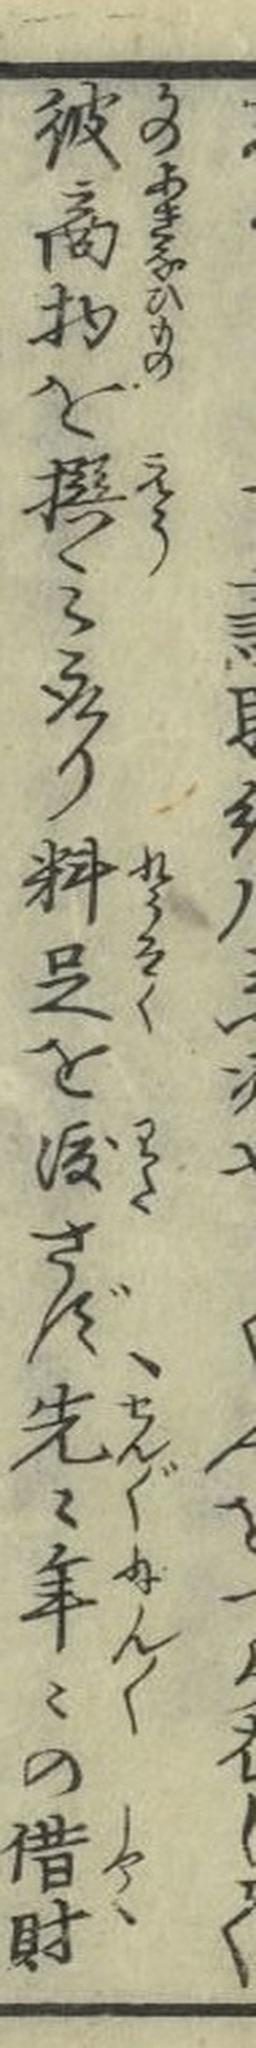彼商物を撰み取り料足を渡さず、先々年々の借財
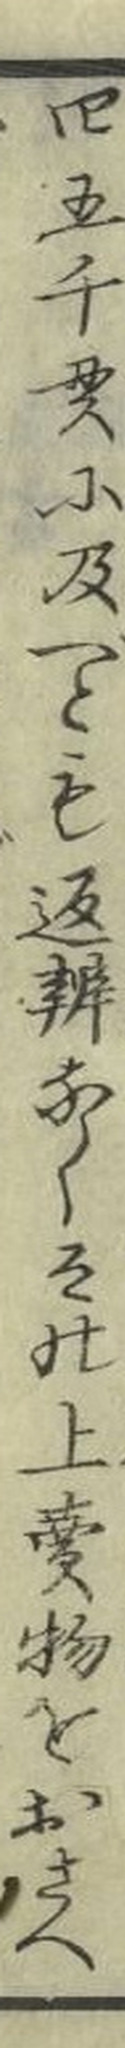四五千貫に及べとも返弁なく、その上売物をおさへ
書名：琉球入貢紀略
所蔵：University of the Ryukyus Library
